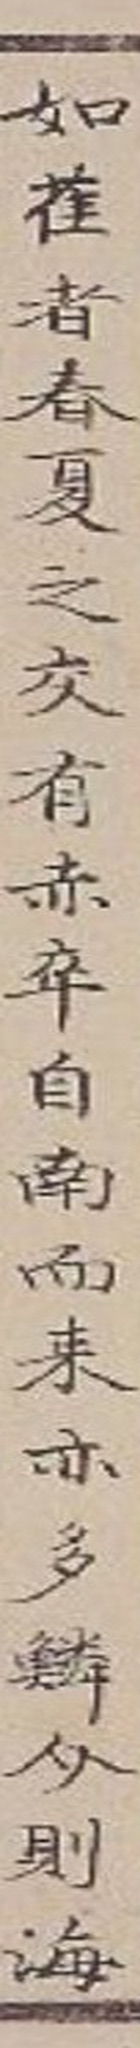如萑者春夏之交有赤卒自南而来亦多鱗介則海
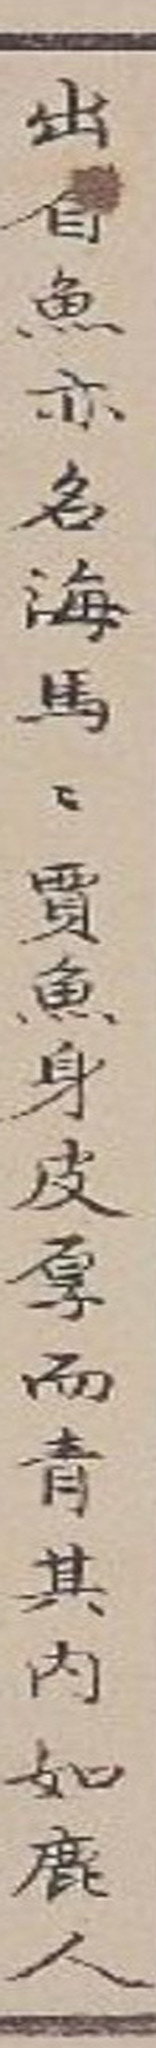出魚亦名海馬々買魚身皮厚而青其内如鹿人
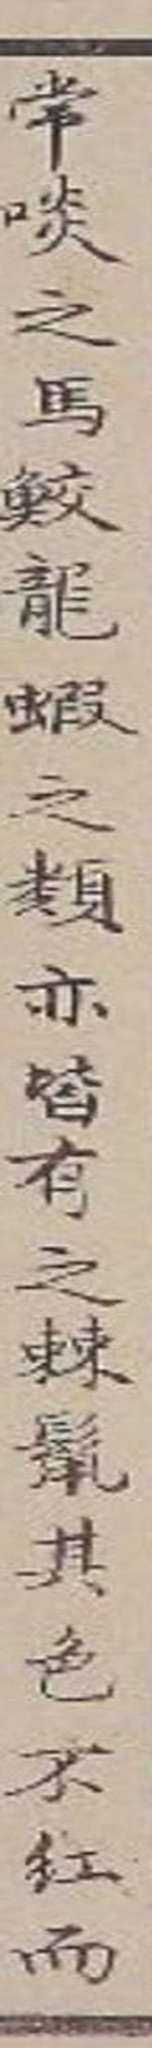常啖之馬鮫竜蝦之類亦皆有之棘鬣其色不紅而

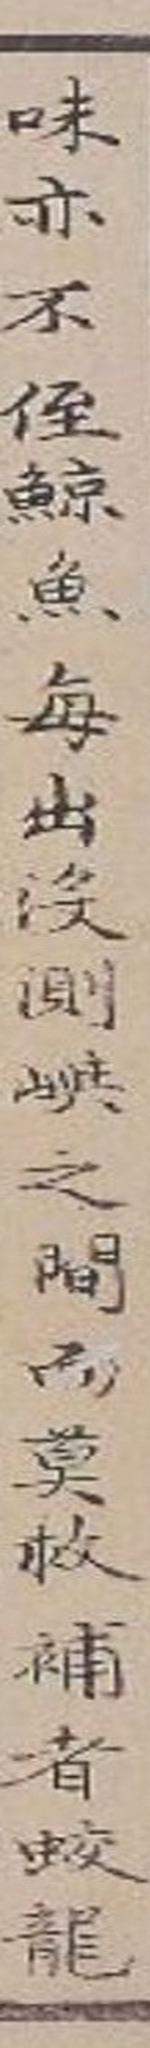味亦不侄鯨魚毎出没測嶼之間而莫救補者蛟竜
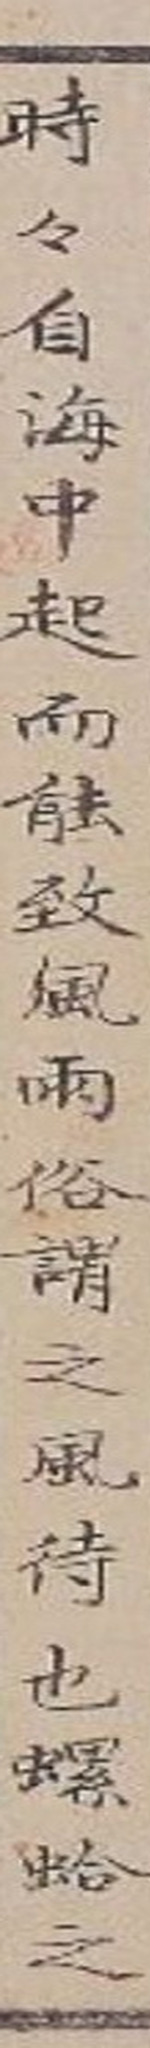時々自海中起而能致風雨俗謂之風待也螺蛤之
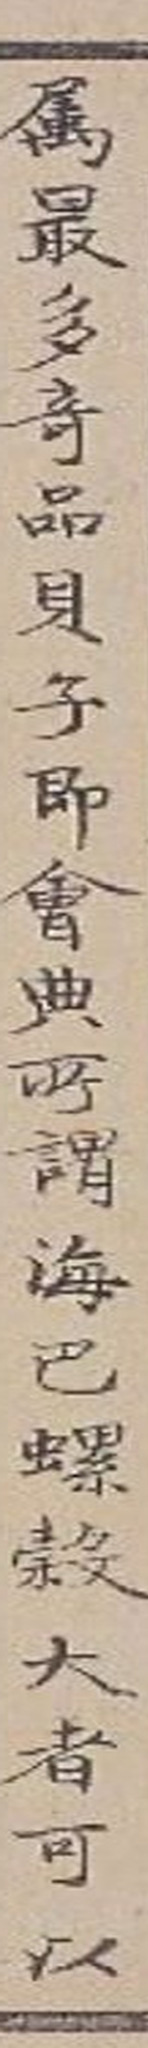属最多奇品貝子即会典所謂海巴螺殻大者可以
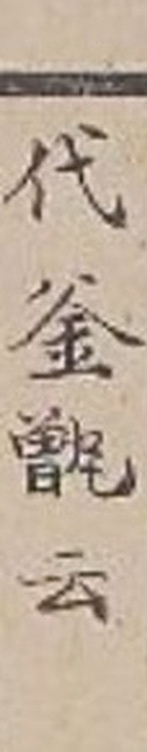代釜甑云
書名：南島志 全
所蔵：University of the Ryukyus Library
